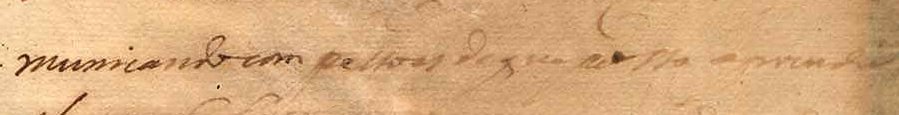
municando com pessoas de que possa aprender
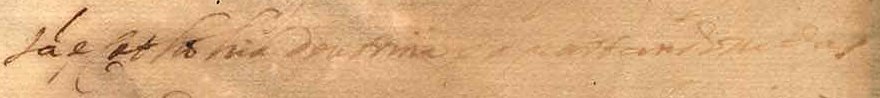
sã, e Catholica doutrina e apartandosse das
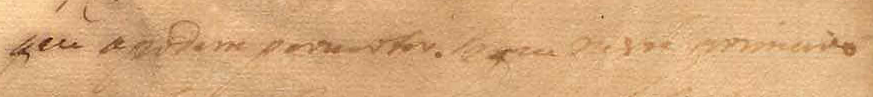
que a podem pevrerter. e que nesse primeiro
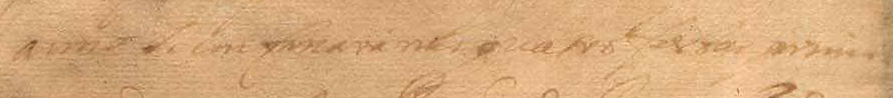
anno se confessará nas quatro festas princi
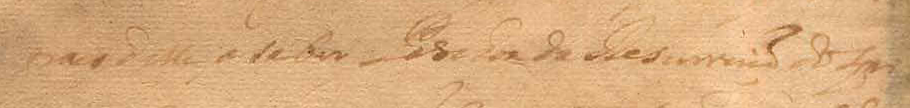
paes disse, a saber, Paschoa da Resurreiçaõ, do Spi
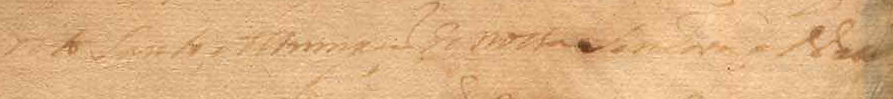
rito Santo, Assumpçaõ de nossa Senhora e Nata
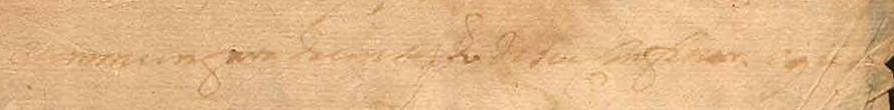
commungara da _ de seu Confessor. e que
